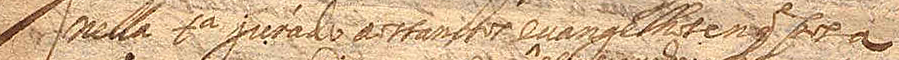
nella ta jurado aos sanctos euangelhos en q̄ pos a
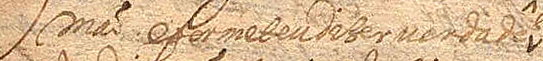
maõ e pormeteu dizer uerdade
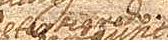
e ter segredo.
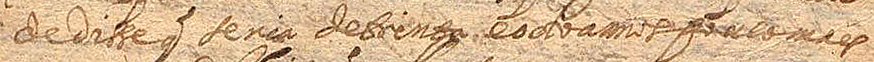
de disse q̄ seria de trinta e octo annos pouco maes
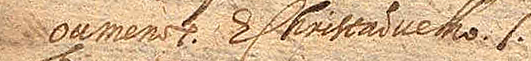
ou menos. E Christaõ uelho./.
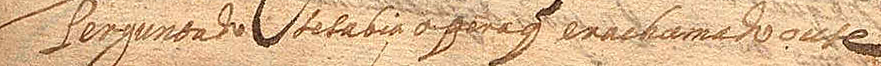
Perguntado se sabia o pera q̄ era chamado ou se
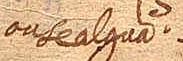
ou se alguā
